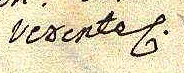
verente C.
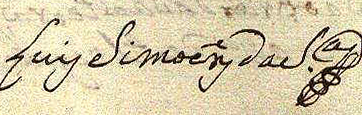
Luis Simoen̄s da S.a
